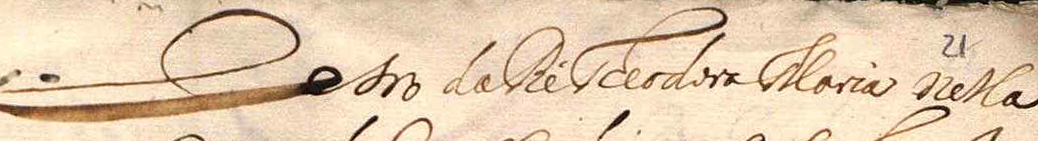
Retro da Re Theodora Maria nella
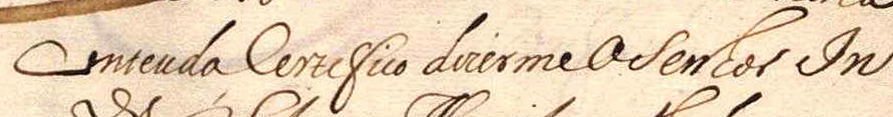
Conteuda, Certifico dizerme o Senhor In
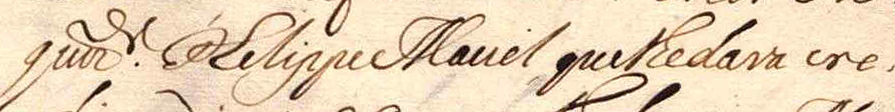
quiz.or Phelippe Maciel, que lhe dava cre
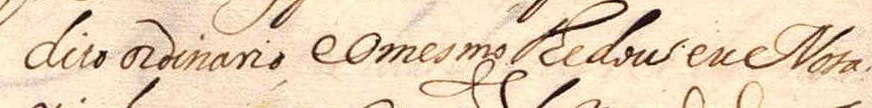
dito ordinario, e o mesmo lhe dou eu Nota
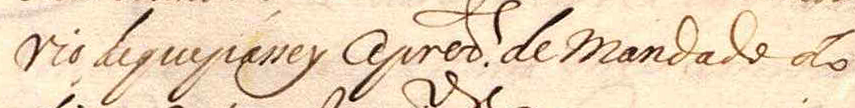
rio, de que passey a prez.te de mandado do
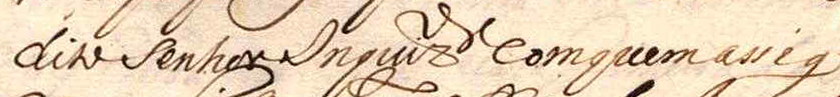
dito Senhor Inquizor com quem assig
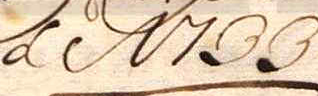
de 1733
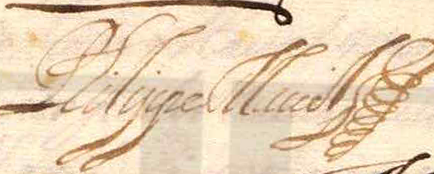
Philippe Maciel
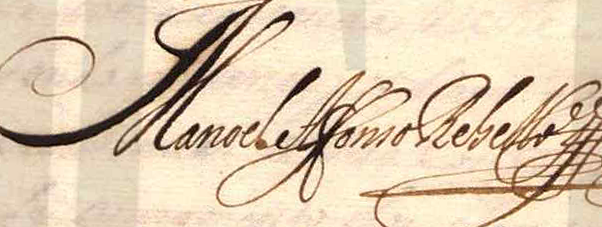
Manoel Affonso Rebello
